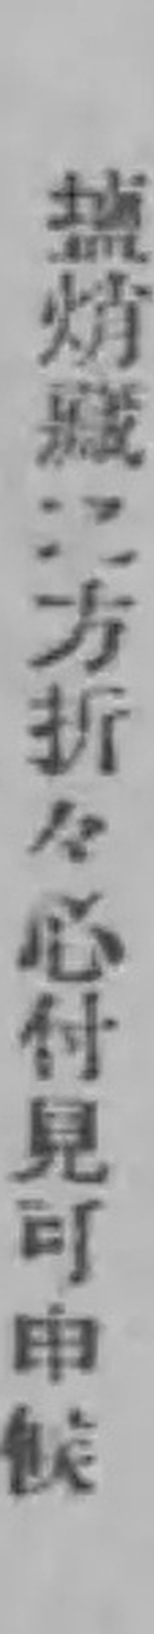塩焇蔵之方折々心付見可申候
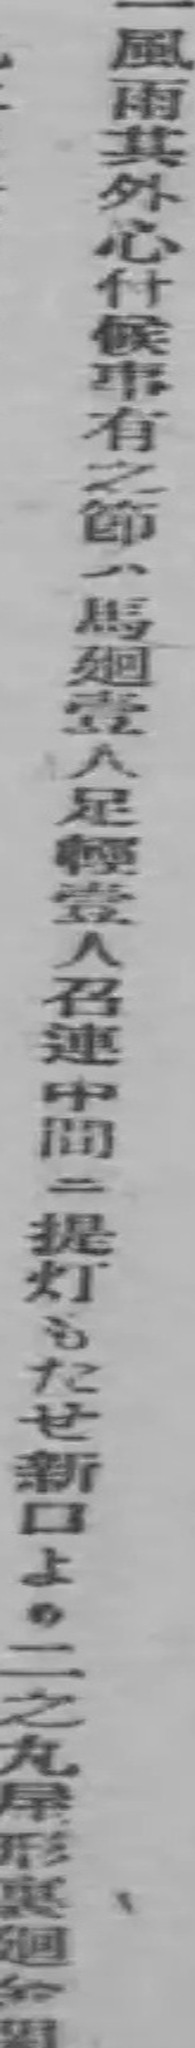一風雨其外心付候事有之節は馬廻壱人足軽壱人召連中間ニ提灯もたせ新口より二之丸屋形裏廻金閑
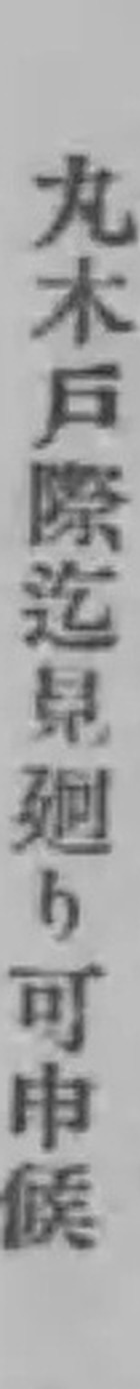丸木戸際迄見廻り可申候
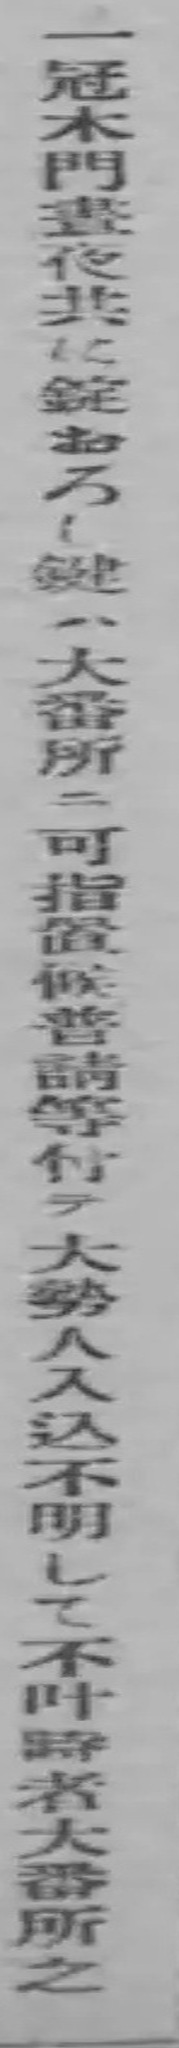一冠木門昼夜共に錠おろし鍵は大番所ニ可指置候普請等付テ大勢人入込不明して不叶時者大番所之
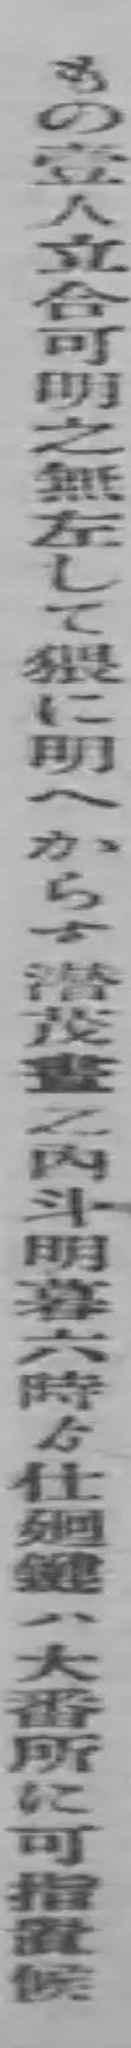もの壱人立合可明之無左して猥に明へからす潜茂昼之内斗明暮六時ゟ仕廻鍵は大番所に可指置候
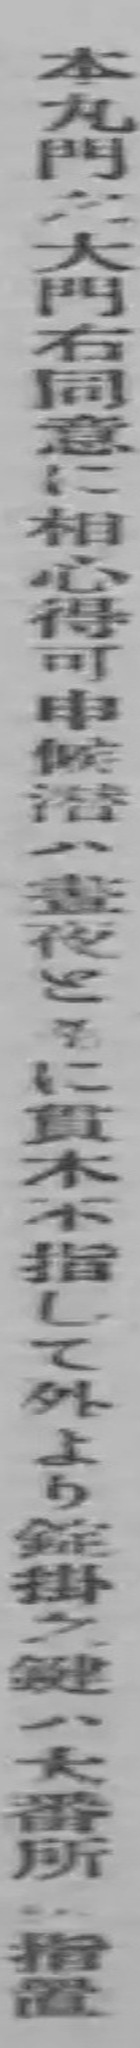本丸門之大門右同意に相心得可申候潜は昼夜ともに貫木不指して外より錠掛之鍵は大番所ニ指置
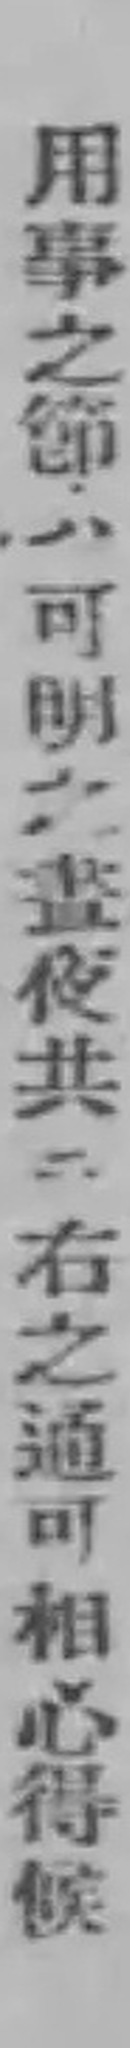用事之節は可明之昼夜共ニ右之通可相心得候
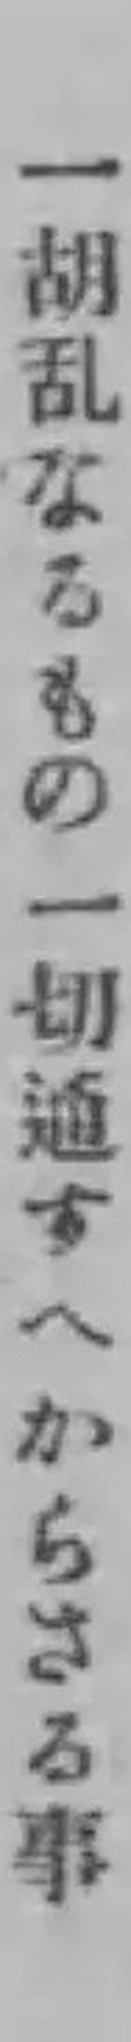一胡乱なるもの一切通すへからさる事
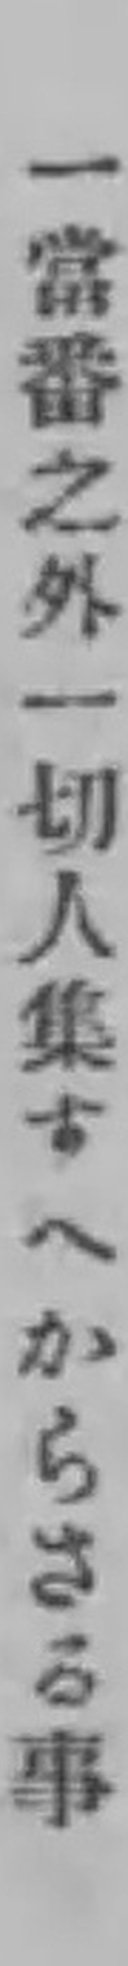一当番之外一切人集すへからさる事
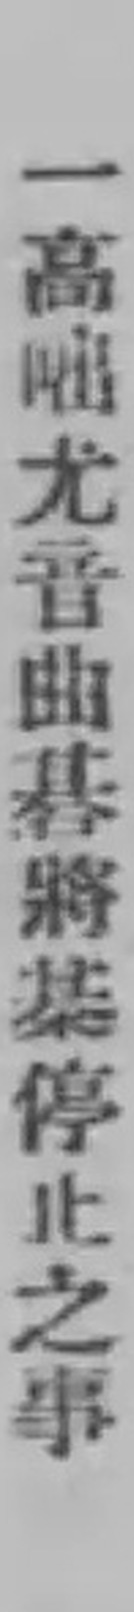一高咄尤音曲碁将棊停止之事
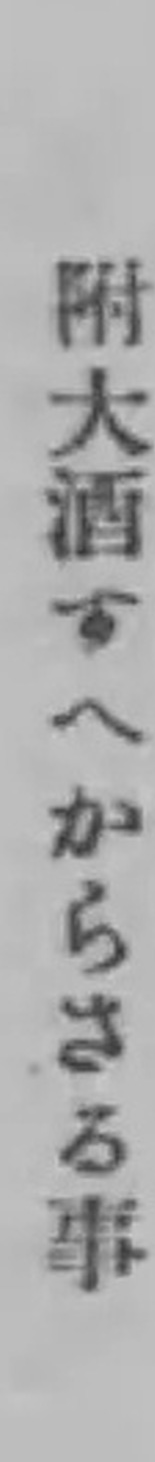附大酒すへからさる事
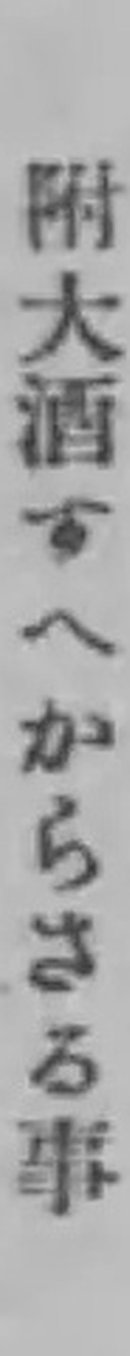附大酒すへからさる事
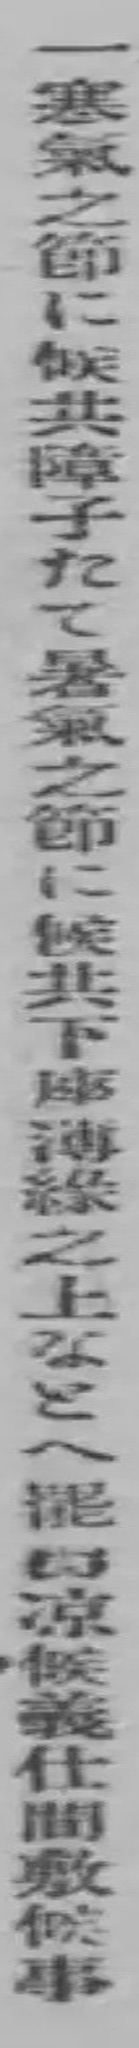一寒気之節に候共障子たて暑気之節に候共下座薄縁之上なとへ罷出涼候義仕間敷候事
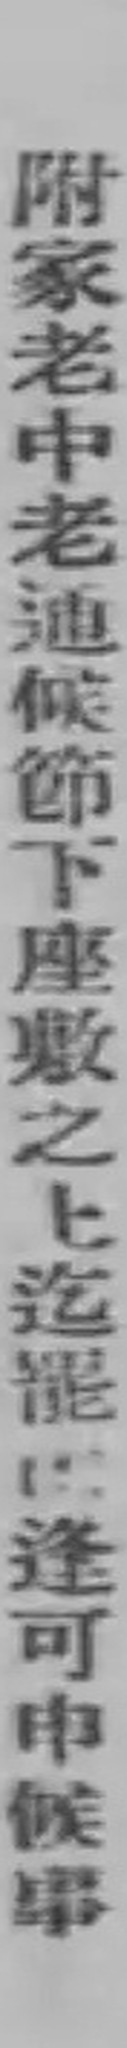附家老中老通候節下座敷之上迄罷出逢可申候事
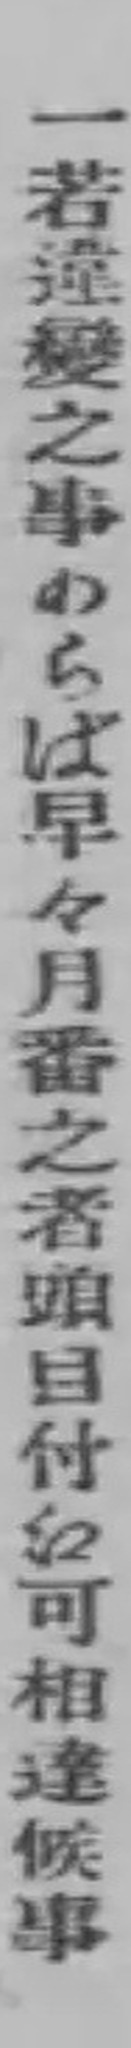一若違変之事あらば早々月番之者頭目付え可相達候事
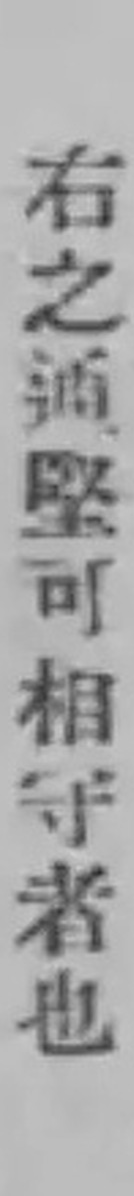右之通堅可相守者也
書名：豊橋市史談
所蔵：国立国会図書館 National Diet Library, JAPAN
